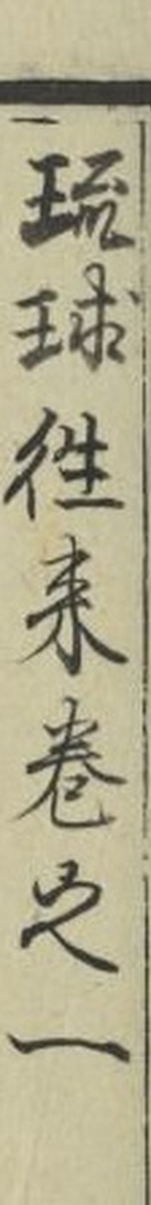琉球往来巻之一
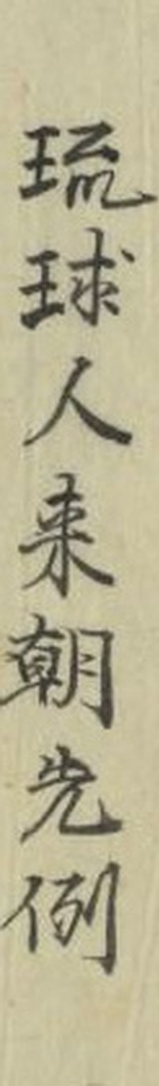琉球人来朝先例
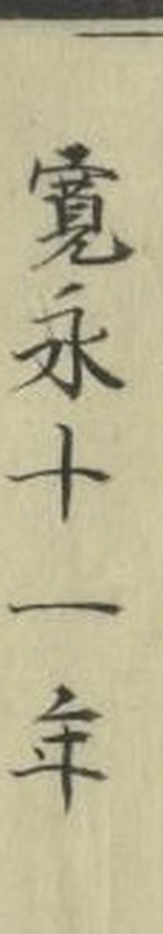寛永十一年
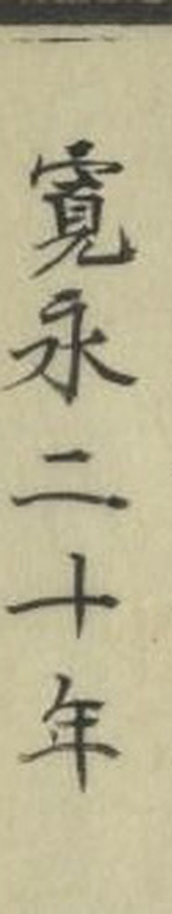寛永二十年
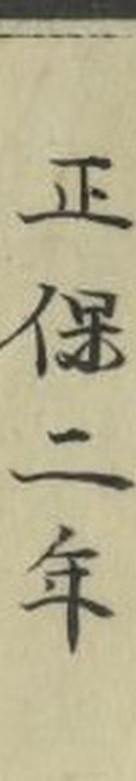正保二年
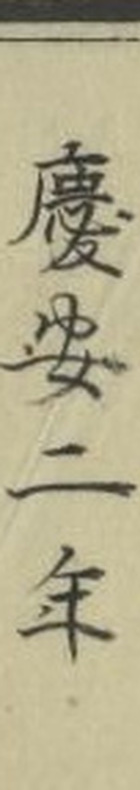慶安二年
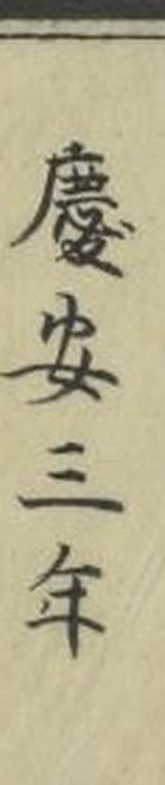慶安三年

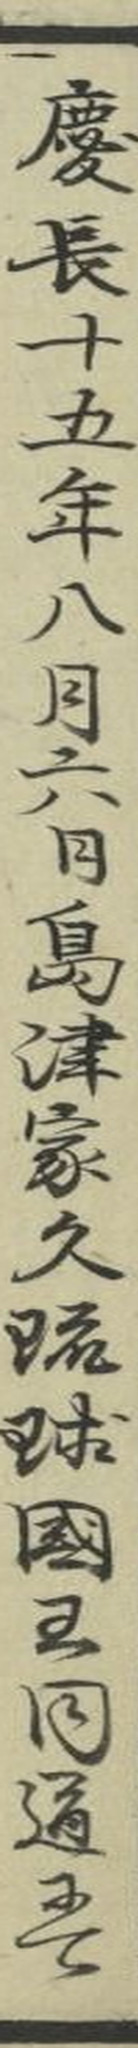慶長十五年八月六日嶋津家久琉球国王同道にて
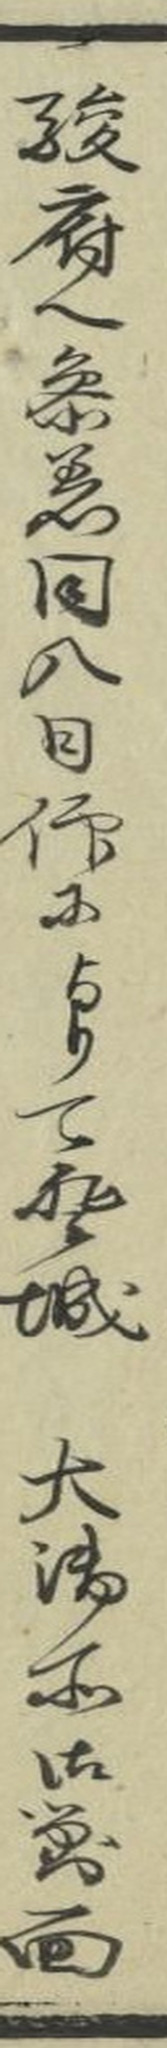駿府へ参着同八日仰にゟりて登城大御所御対面
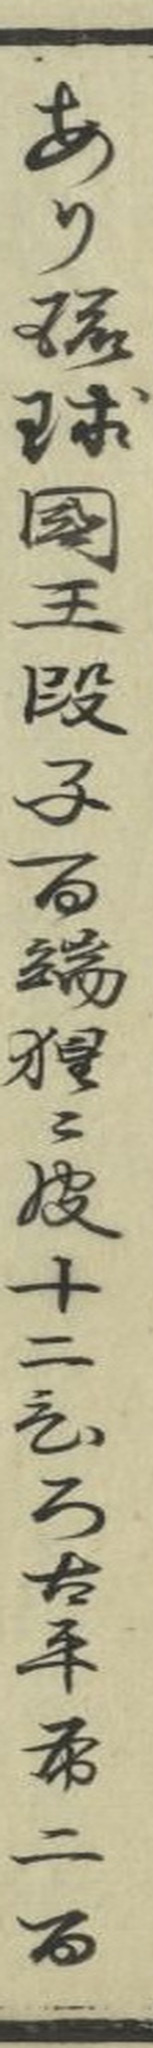あり琉球国王緞子百端猩々皮十二ひろ太平布二百
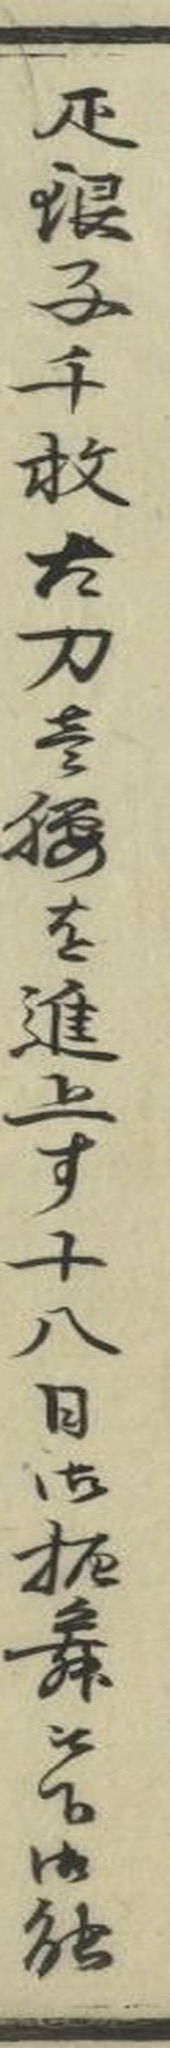疋銀子千枚太刀一腰を進上す十八日御振舞被下御能
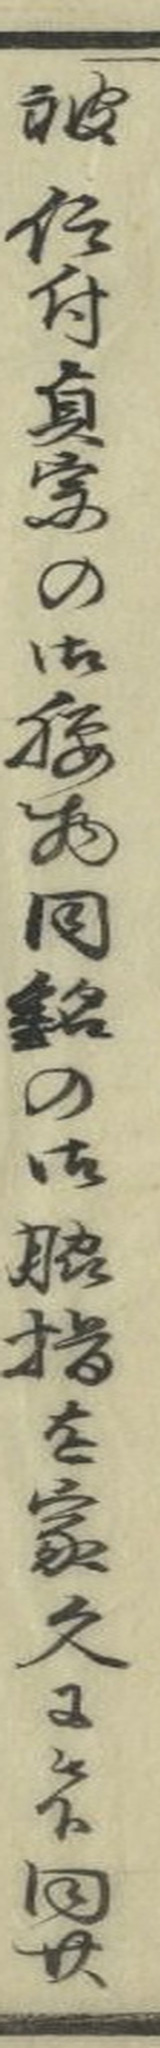被仰付貞宗の御腰物同銘の御脇指を家久に被下同廿
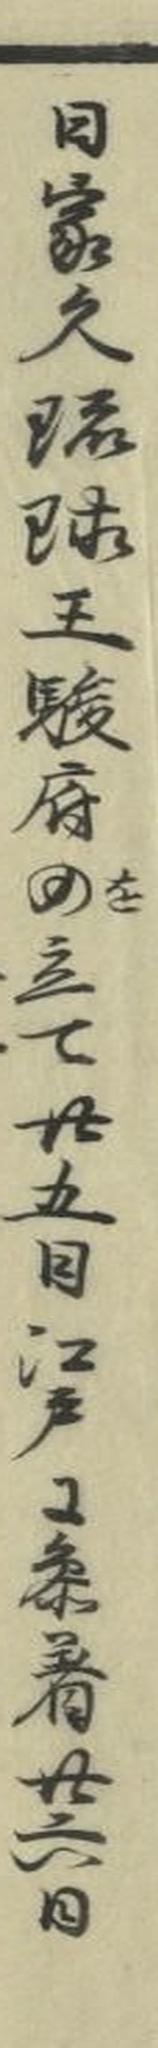日家久琉球王駿府を立て廿五日江戸に参着廿六日
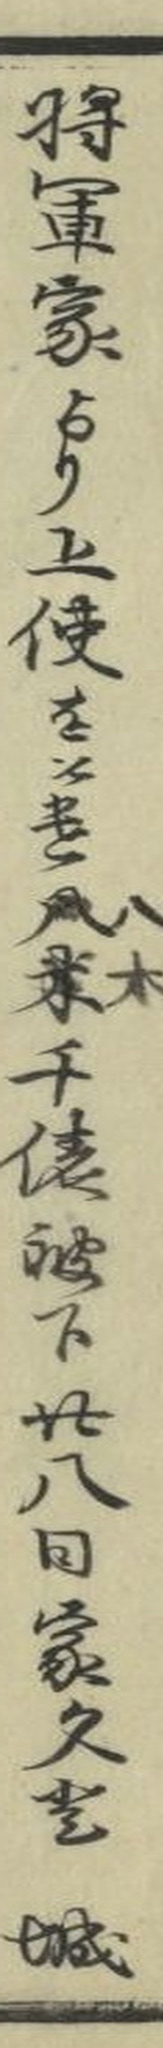将軍家ゟり上使を被遣八木千俵被下廿八日家久登城
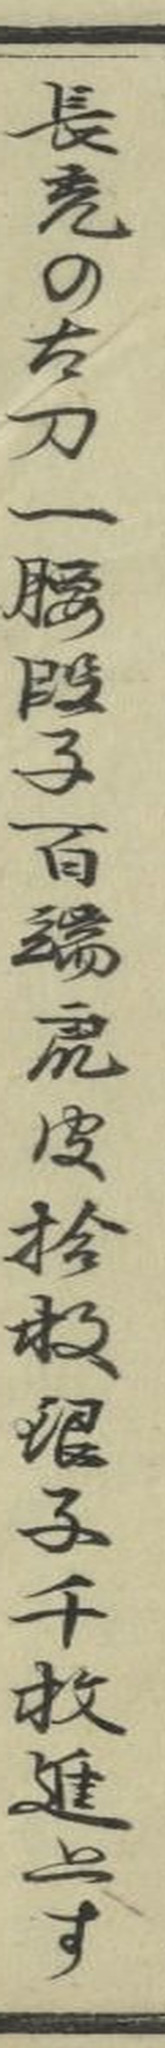長充の太刀一腰緞子百端虎皮拾枚銀子千枚進上す
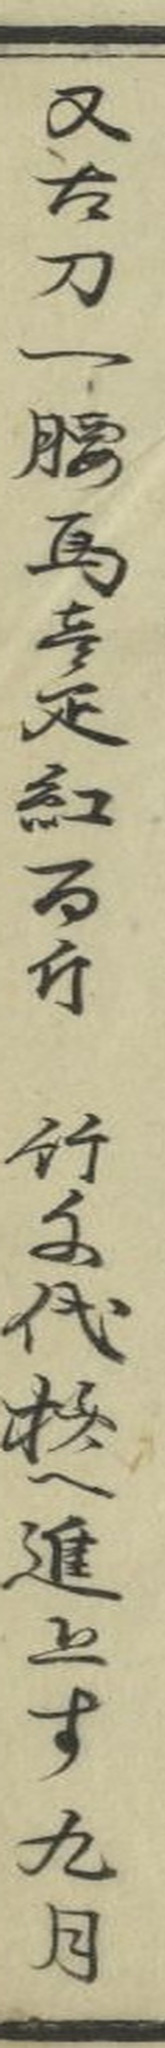又太刀一腰馬一疋紅百斤竹千代様へ進上す九月
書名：琉球往来（上）
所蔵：University of the Ryukyus Library
